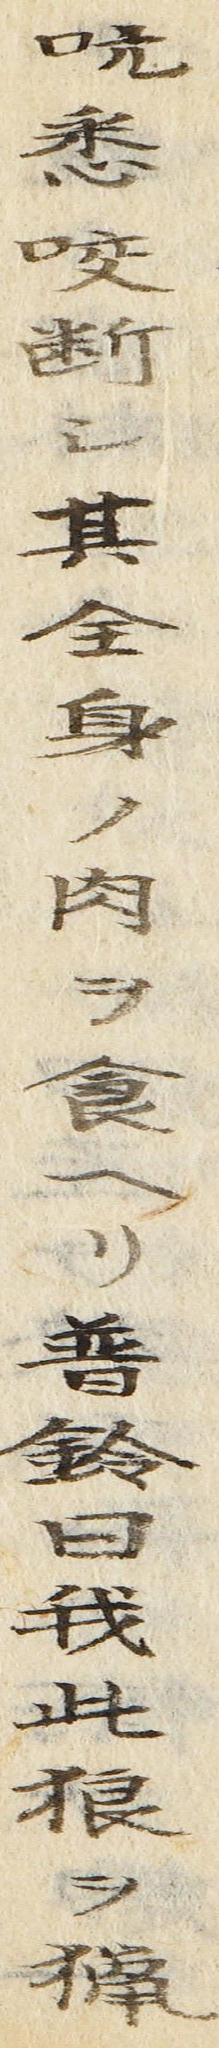吭悉咬断シ其全身ノ肉ヲ食ヘリ普鈴曰我此狼ヲ猟
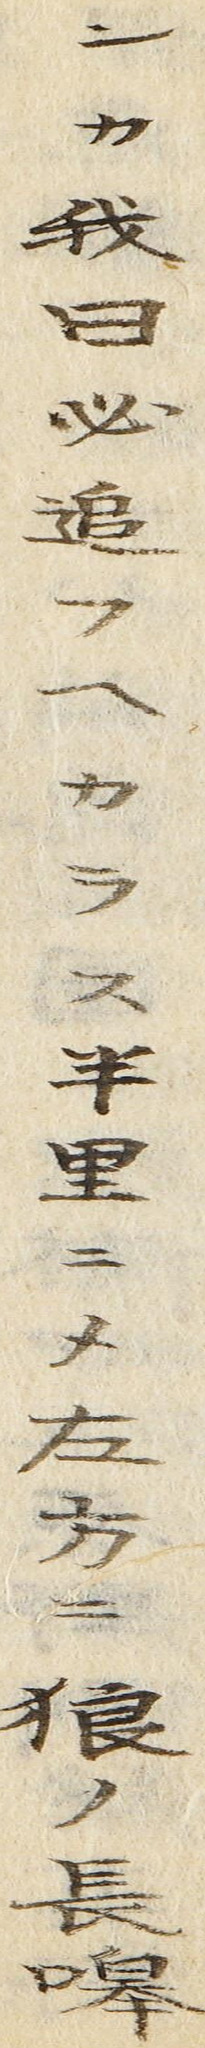ンカ我曰必追フヘカラス半里ニシテ左方ニ狼ノ長嗥
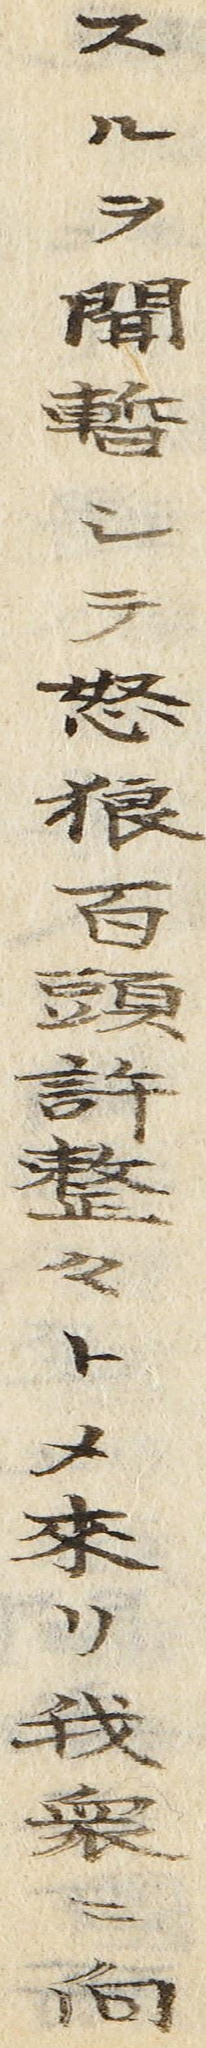スルヲ聞暫シテ怒狼百頭許整々トシテ来リ我衆ニ向
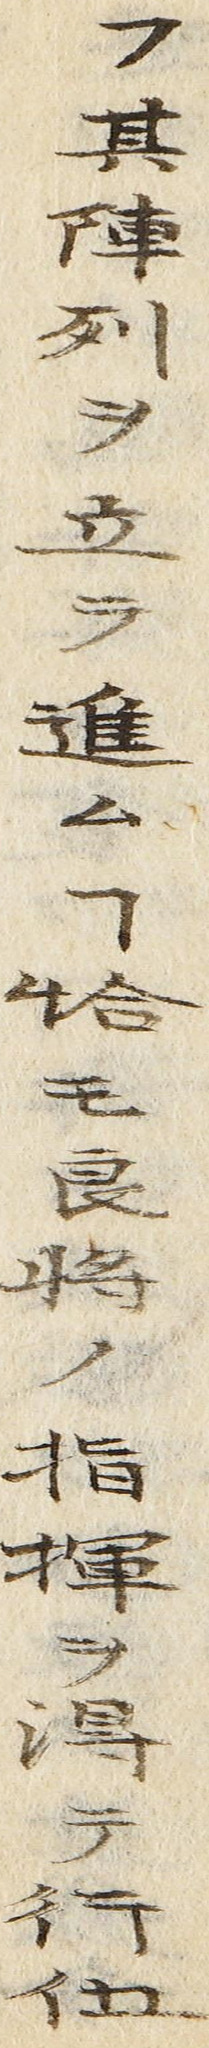フ其陣列ヲ立テ進ムコト恰モ良将ノ指揮ヲ得テ行伍
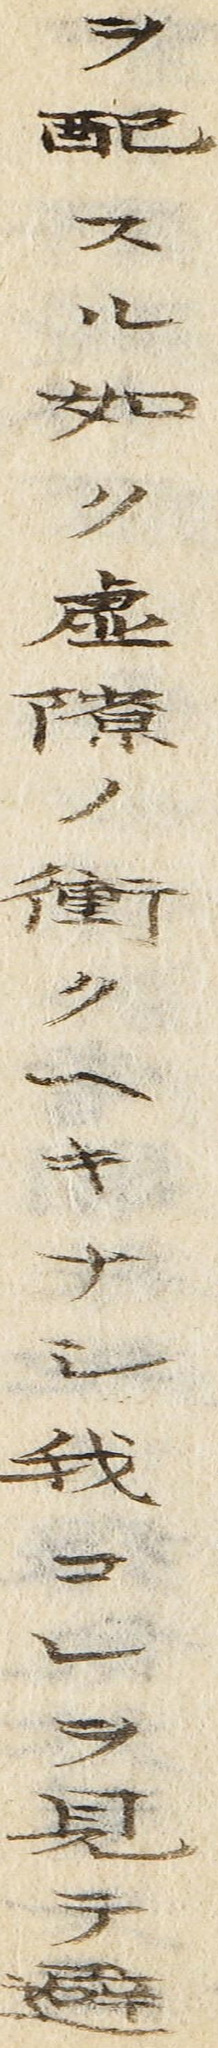ヲ配スル如ク虚隙ノ衝クヘキナシ我コレヲ見テ避
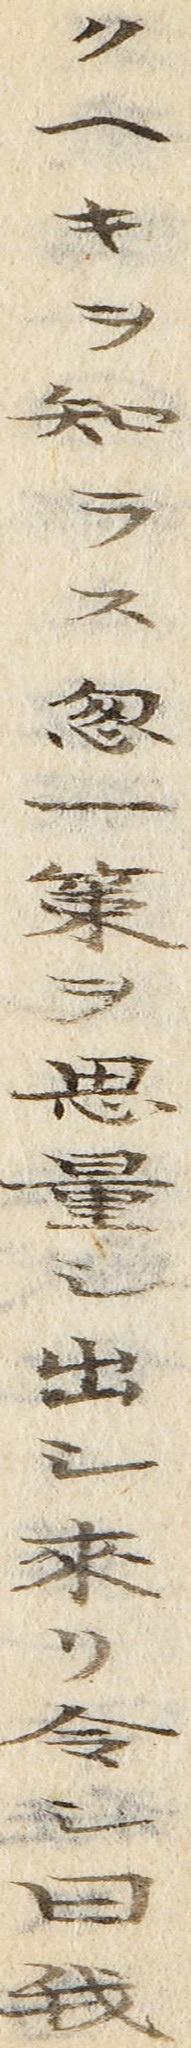クヘキヲ知ラス忽一策ヲ思量シ出シ来リ令シ曰我
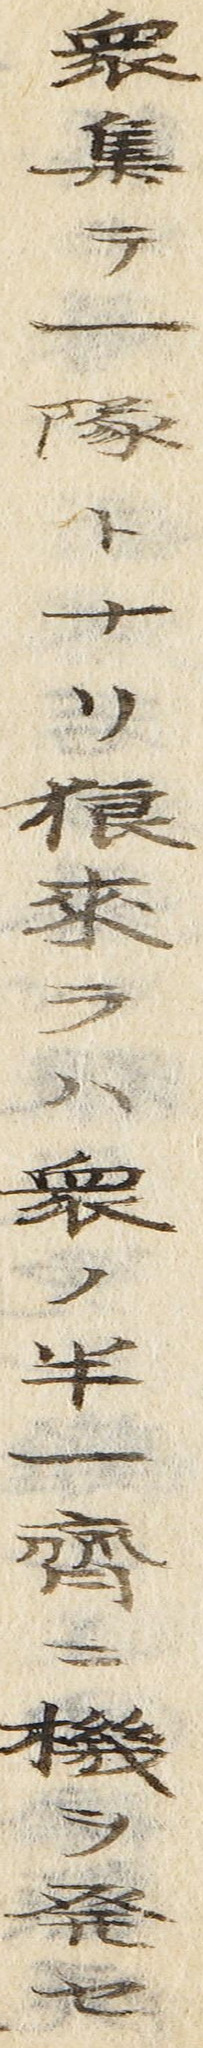衆集テ一隊トナリ狼来ラハ衆ノ半一斉ニ機ヲ発セ
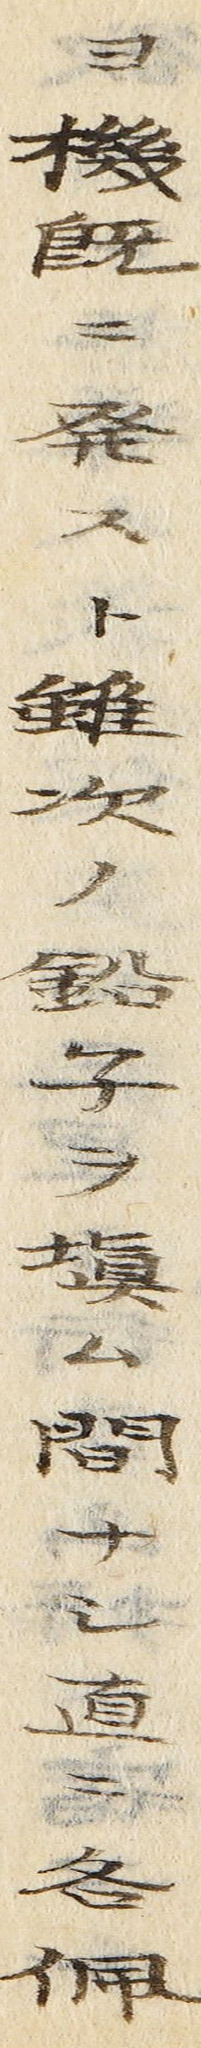ヨ機既ニ発スト雖次ノ鉛子ヲ填ム間ナシ直ニ各佩
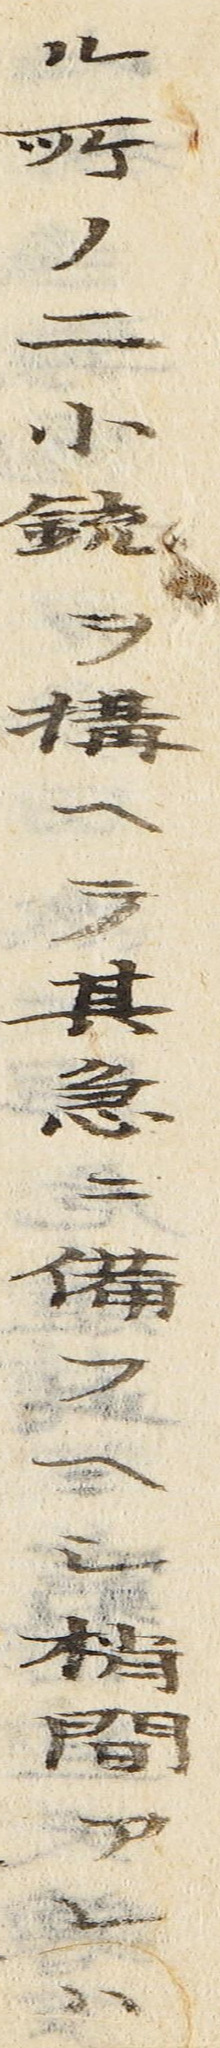ル所ノ二小銃ヲ搆ヘテ其急ニ備フヘシ梢間アレハ
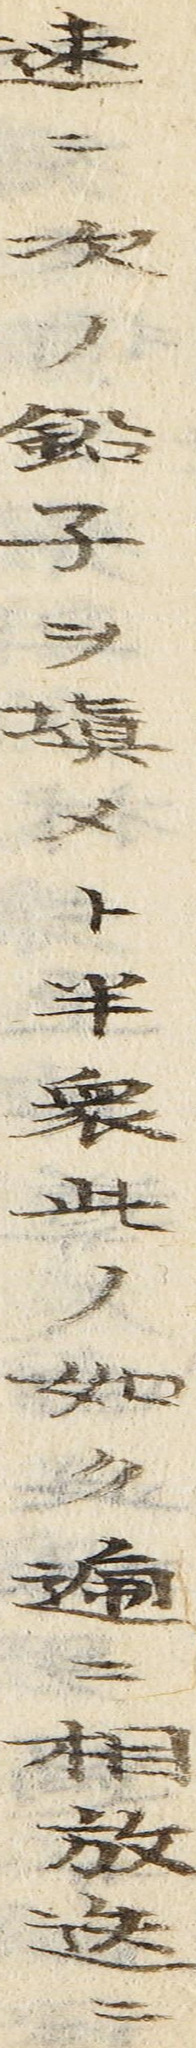速ニ次ノ鉛子ヲ填メト半衆此ノ如ク逓ニ相放迭ニ
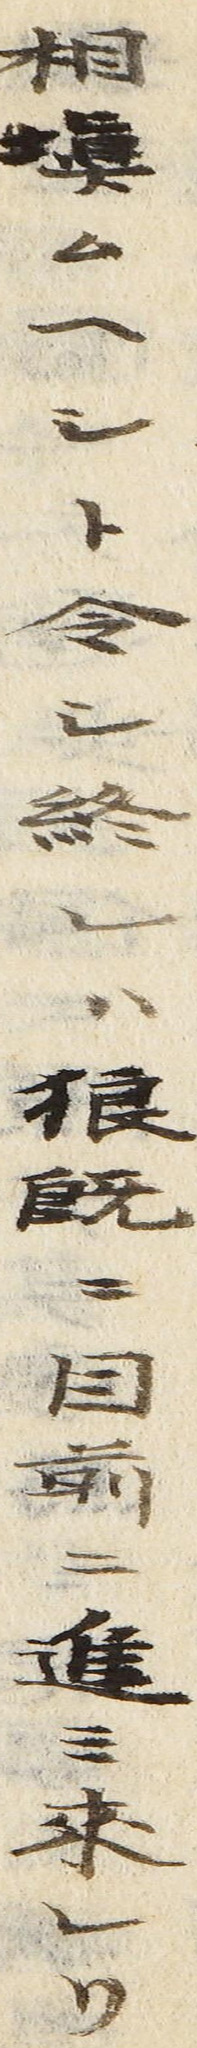相填ムヘシト令シ終レハ狼既ニ目前ニ進ミ来レリ
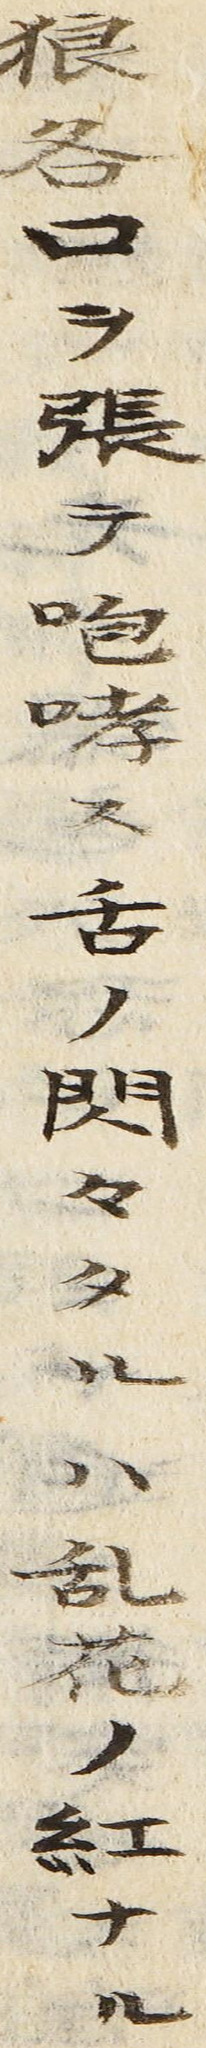狼各口ヲ張テ咆哮ス舌ノ閃々タルハ乱花ノ紅ナル
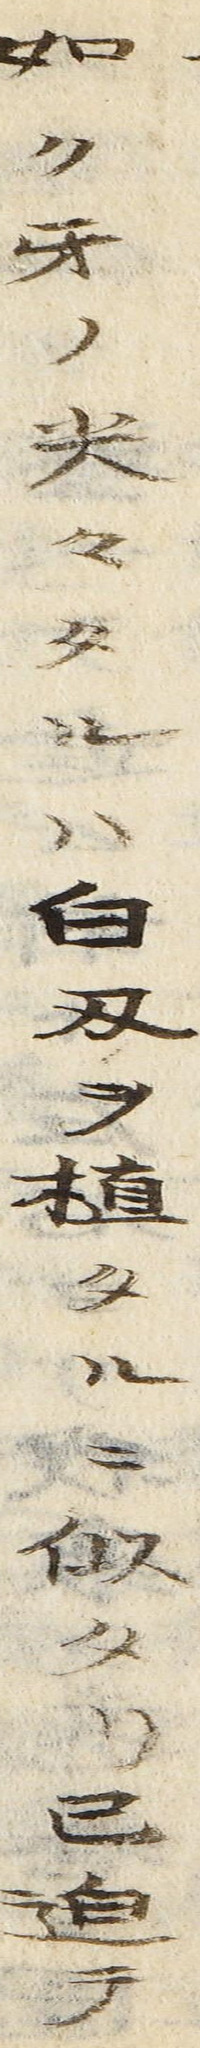如ク牙ノ尖々タルハ白刃ヲ植タルニ似タリ已迫テ
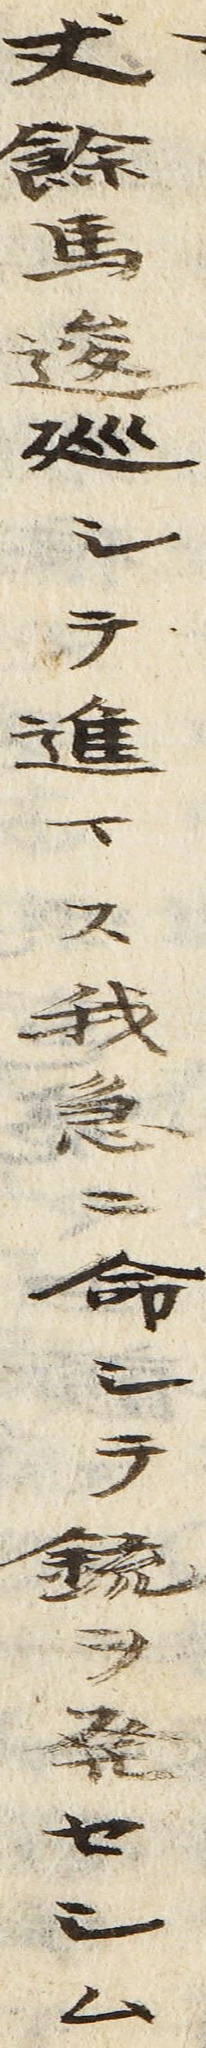丈余馬逡巡シテ進マス我急ニ命シテ銃ヲ発セシム
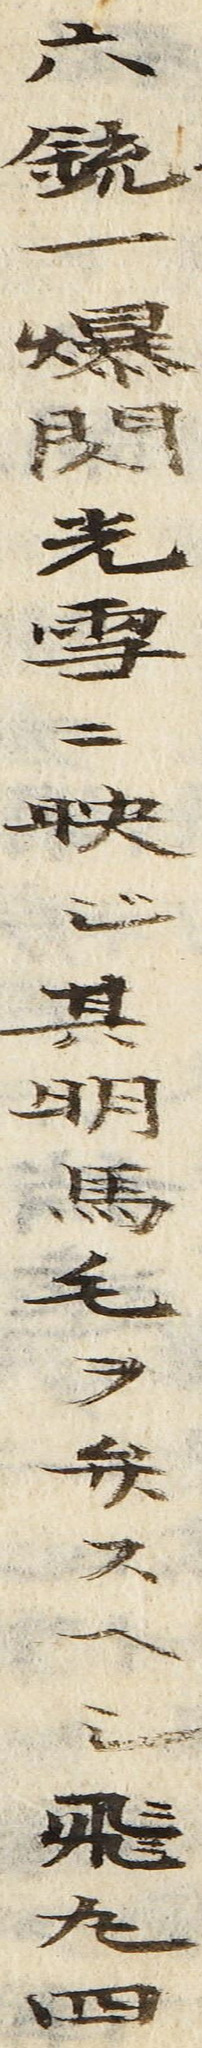六銃一爆閃光雪ニ映ジ其明馬毛ヲ弁スヘシ飛丸四
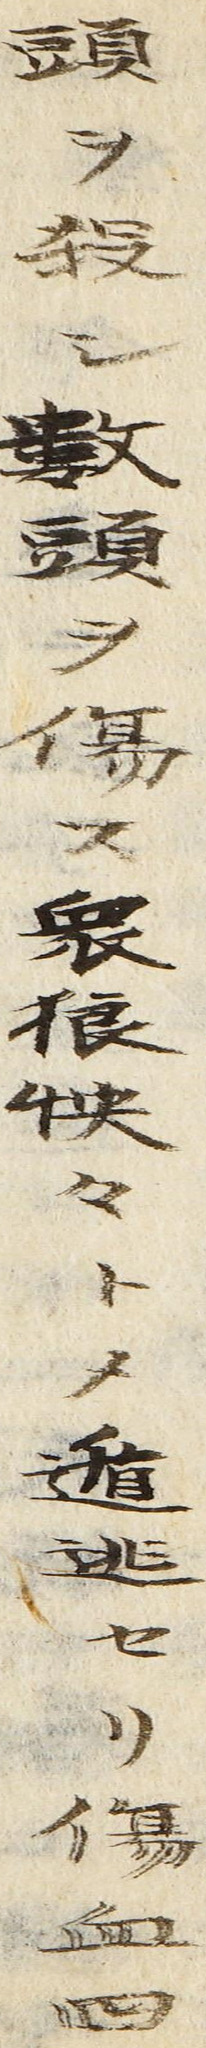頭ヲ殺シ数頭ヲ傷ス衆狼怏々トシテ遁逃セリ傷血四
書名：漂流紀事
